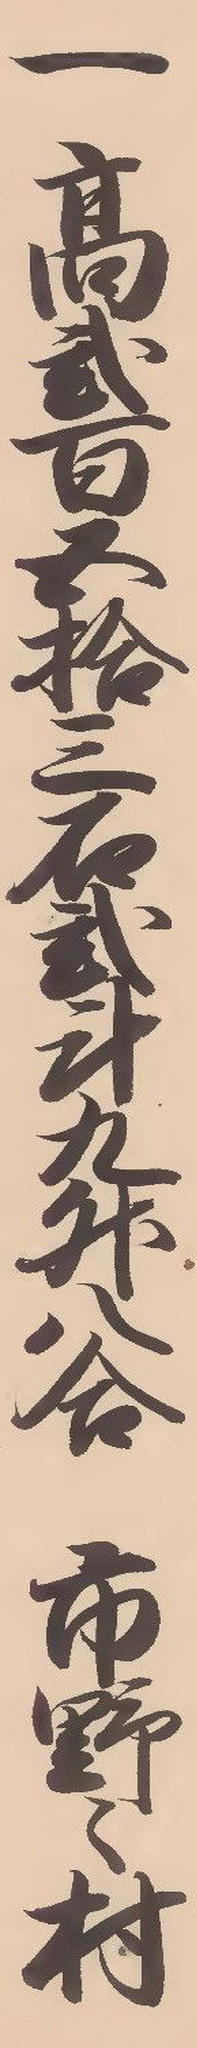一高弐百五拾三石弐斗九升八合市野々村

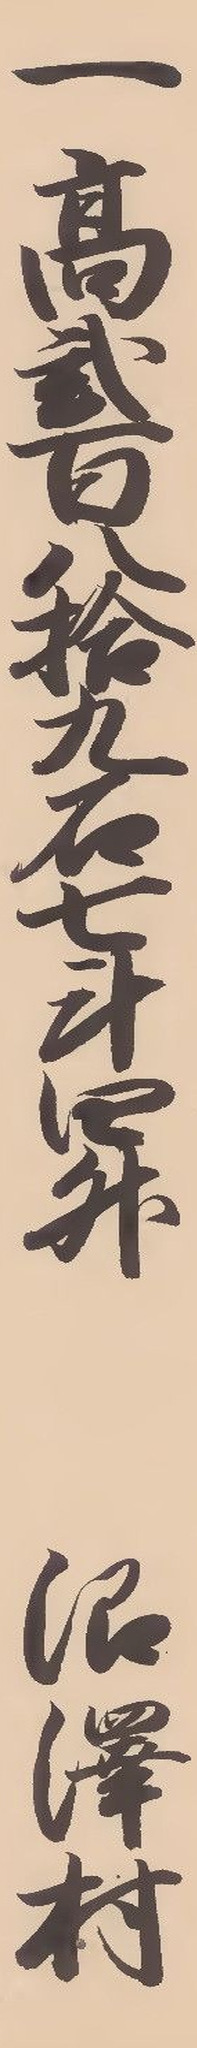一高弐百八拾九石七斗四升沼沢村
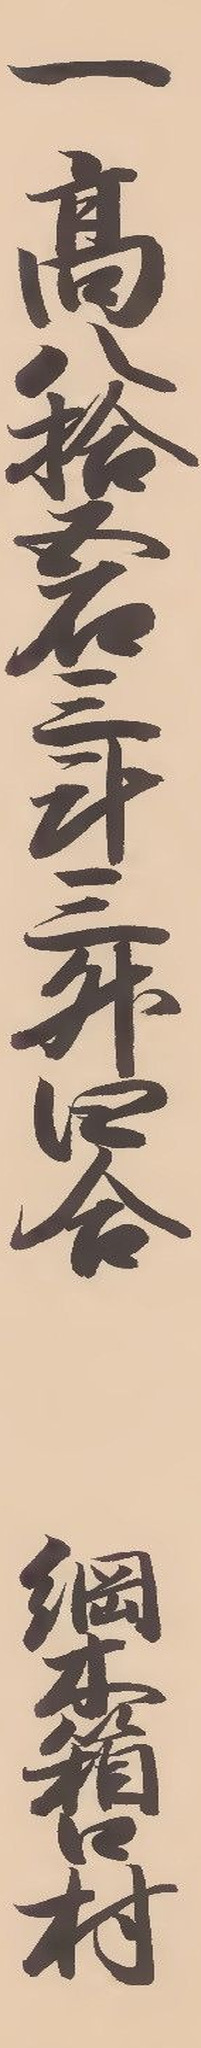一高八拾五石三斗三升四合綱木箱口村
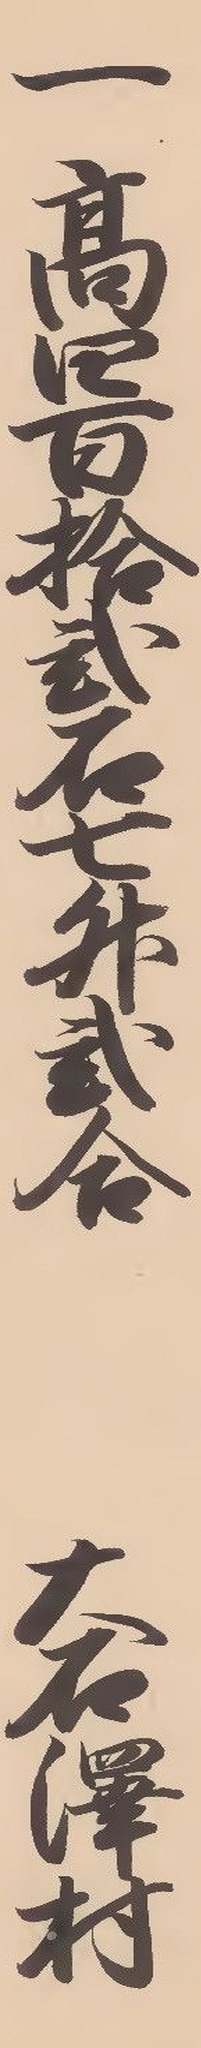一高四百拾弐石七升弐合大石沢村
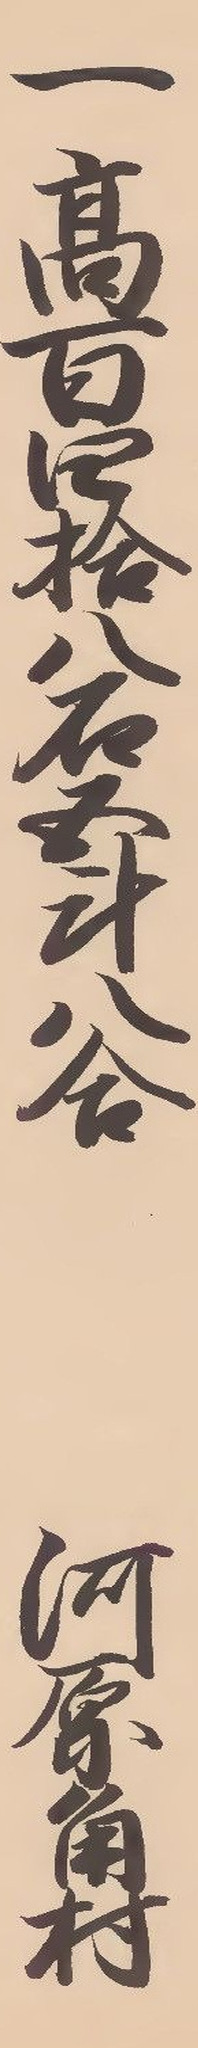一高百四拾八石五斗八合河原角村
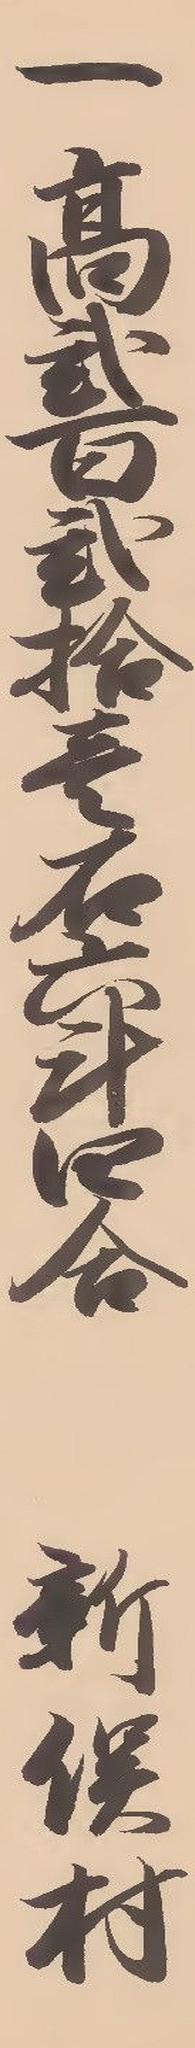一高弐百弐拾壱石六斗四合新俣村
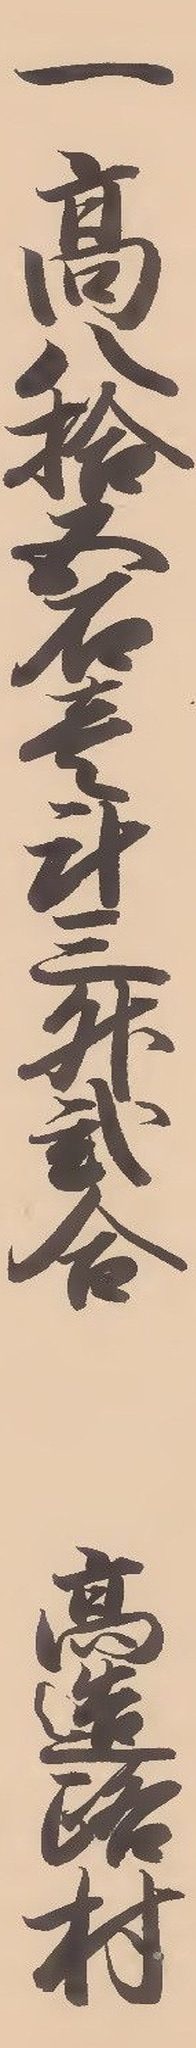一高八拾五石壱斗三升弐合高造路村
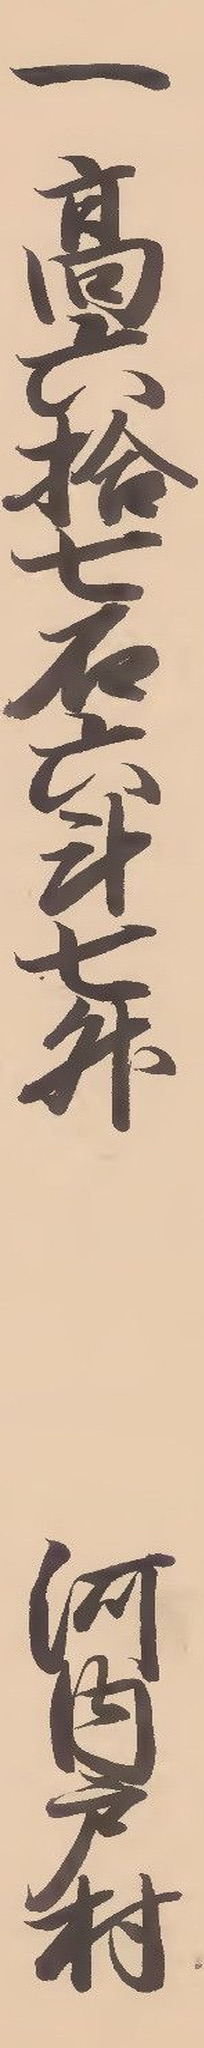一高六拾七石六斗七升河内戸村
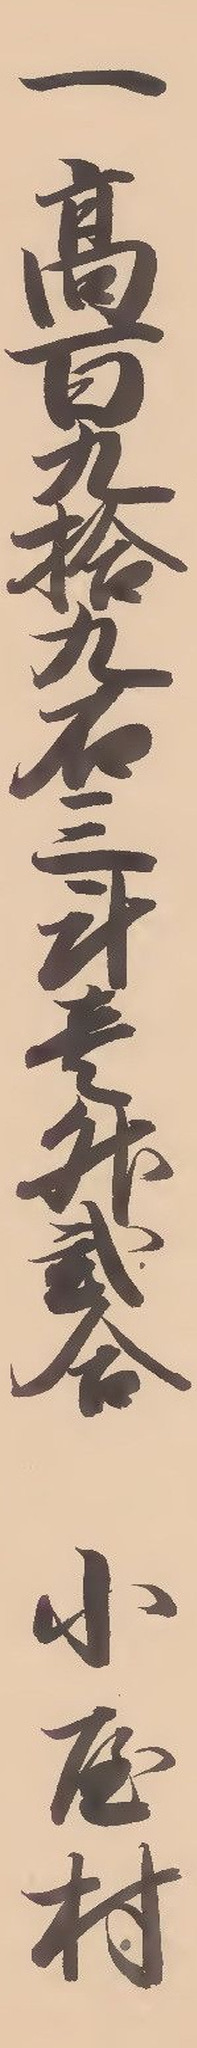一高百九拾九石三斗壱升弐合小屋村

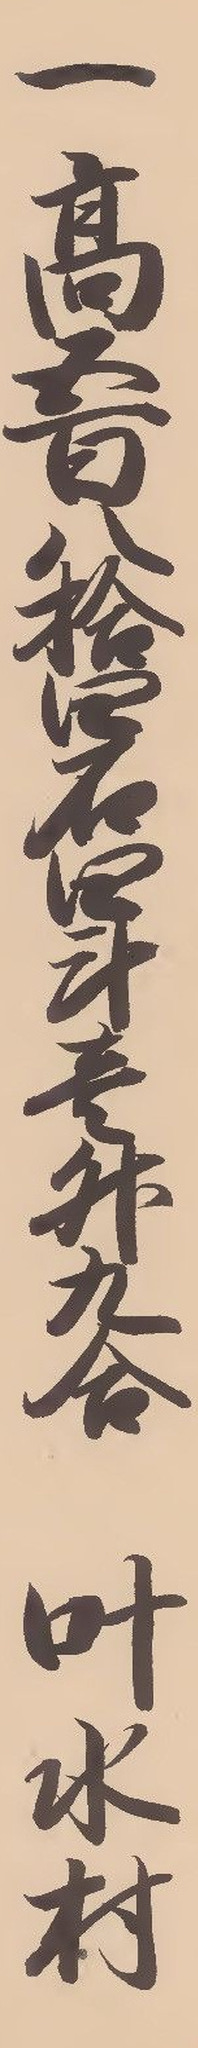一高五百八拾四石四斗壱升九合叶水村
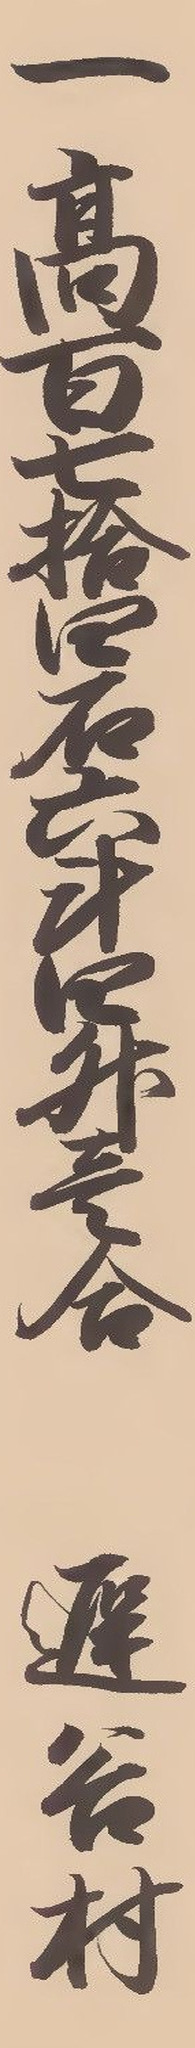一高百七拾四石六斗四升壱合遅谷村
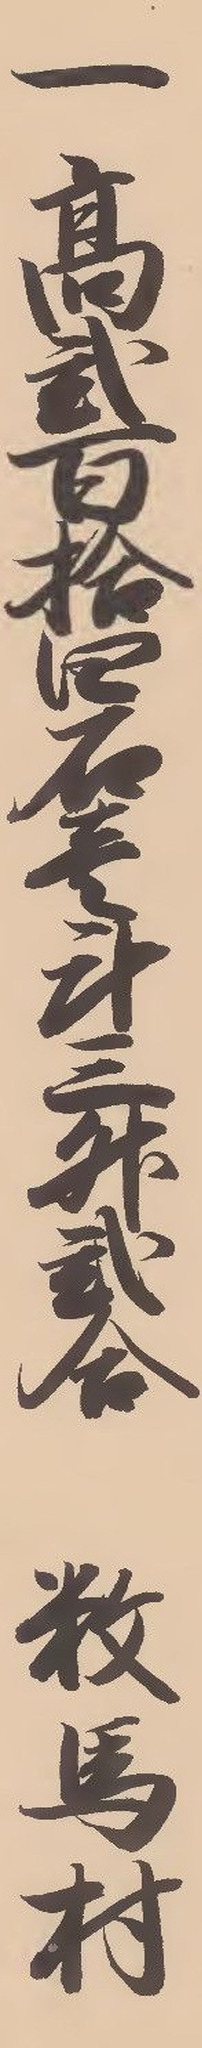一高弐百拾四石壱斗三升弐合数馬村
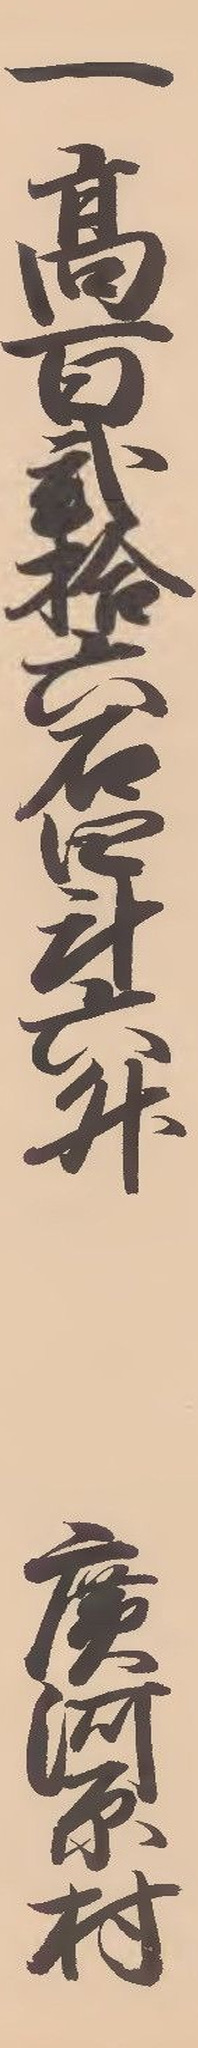一高百弐拾六石四斗六升広河原村
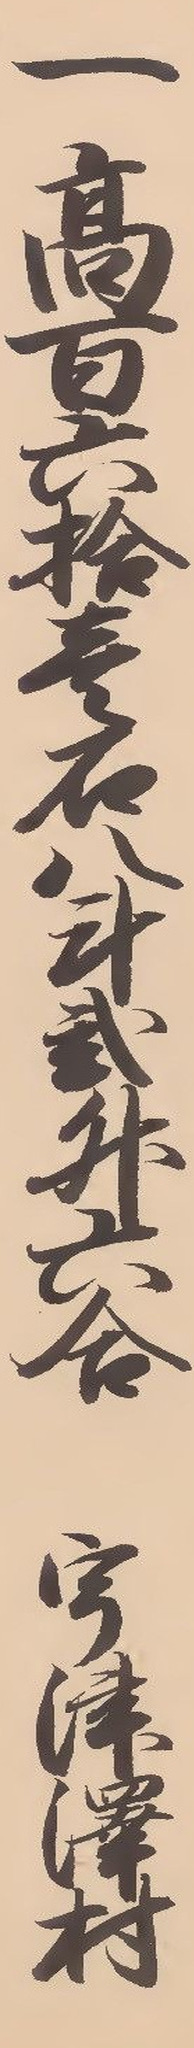一高百六拾壱石八斗弐升六合宇津沢村
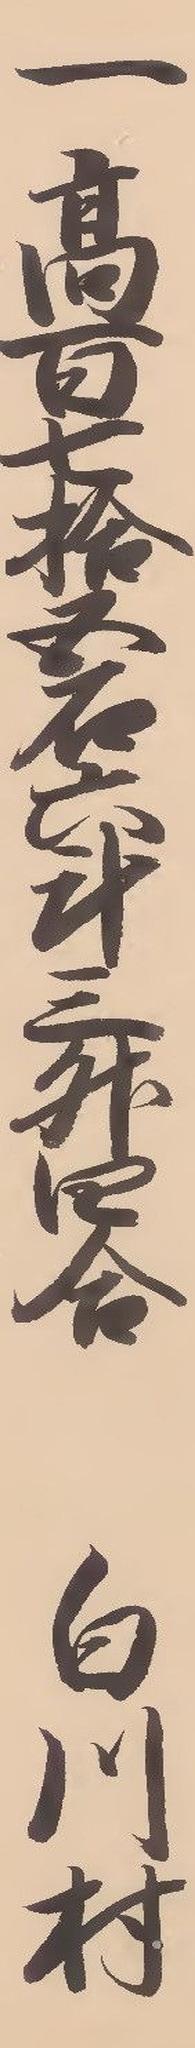一高百七拾五石六斗三升四合白川村
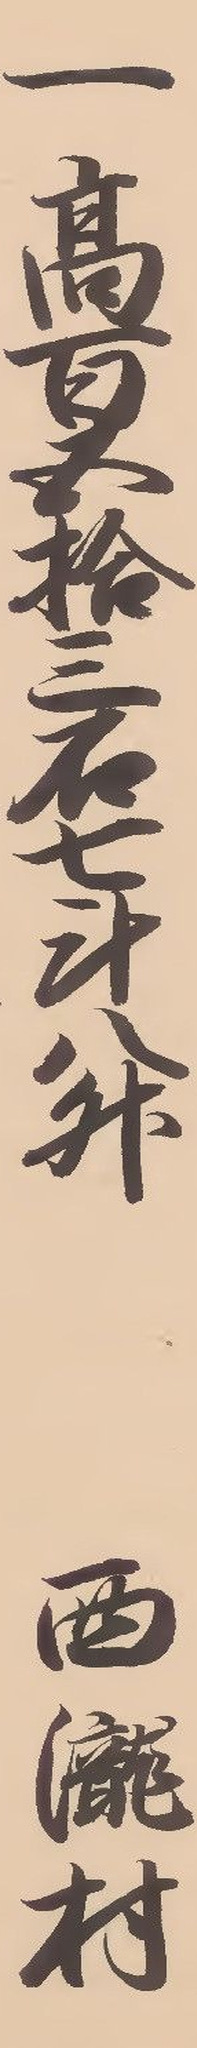一高百五拾三石七斗八升西滝村
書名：出羽国郷帳　１
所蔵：国立公文書館 National Archives of Japan
